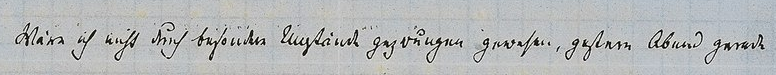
Wäre ich nicht durch besondere Umstände gezwungen gewesen, gestern Abend gerade
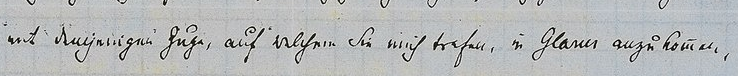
mit demjenigen Zuge, auf welchem Sie mich trafen, in Glarus anzukommen,
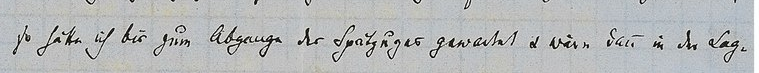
so hätte ich bis zum Abgange des Spätzuges gewartet & wäre dann in der Lage
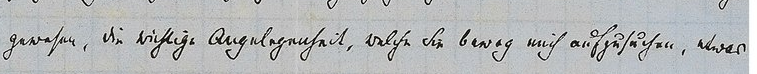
gewesen, die wichtige Angelegenheit, welche Sie bewog mich aufzusuchen, etwas
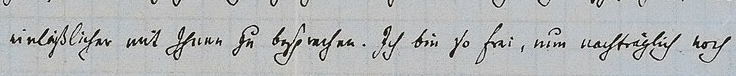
einläßlicher mit Ihnen zu besprechen. Ich bin so frei, nun nachträglich noch
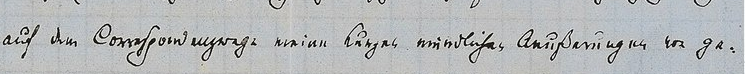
auf dem Correspondenzwege meine kurzen mündlichen Aeußerungen von ge-
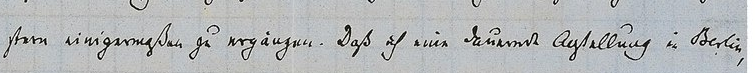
stern einigermaßen zu ergänzen. Daß ich eine dauernde Anstellung in Berlin,
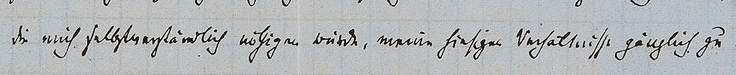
die mich selbstverständlich nöthigen würde, meine hiesigen Verhältnisse gänzlich zu
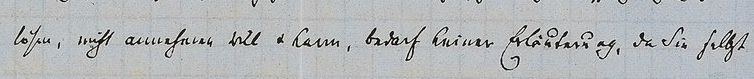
lösen, nicht annehmen will & kann, bedarf keiner Erläuterung, da Sie selbst
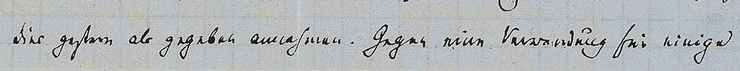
dies gestern als gegeben annahmen. Gegen eine Verwendung für einige
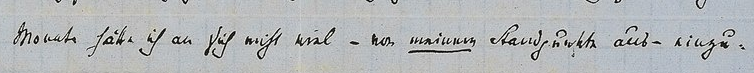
Monate hätte ich an sich nicht viel – von meinem Standpunkte aus – einzu-
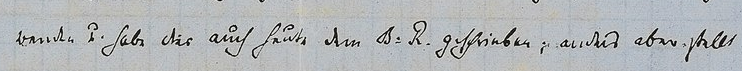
wenden u. habe dies auch heute dem B-R. geschrieben; anders aber stellt
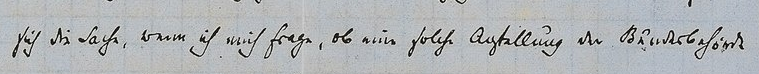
sich die Sache, wenn ich mich frage, ob eine solche Anstellung der Bundesbehörde
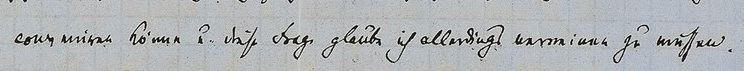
conveniren könne u. diese Frage glaube ich allerdings verneinen zu müssen.
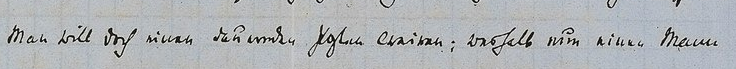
Man will doch einen dauernden Posten creiren; weshalb nun einen Mann
